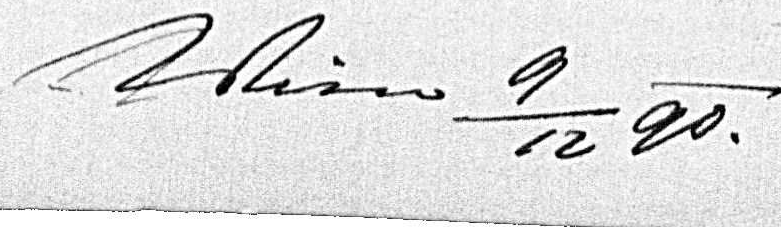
Wien 9/12 90.
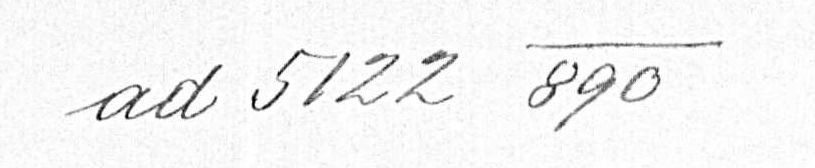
ad 5122 890
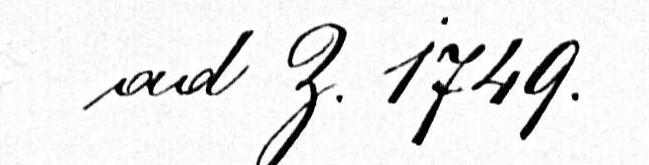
ad Z. 1749.
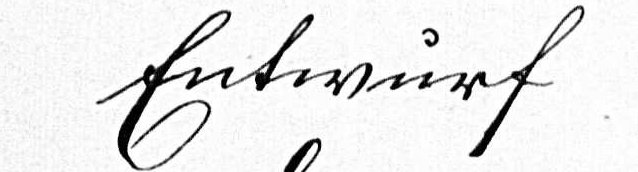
Entwurf
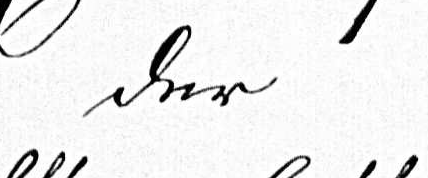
der
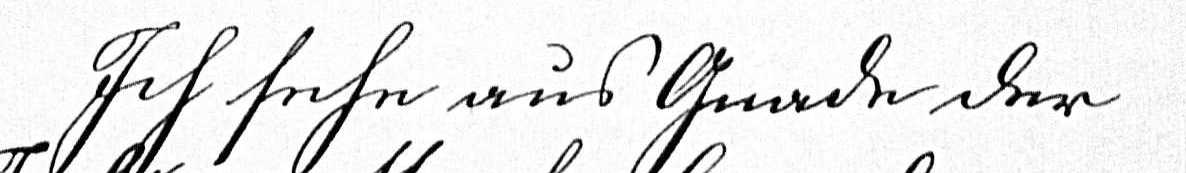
Jch sehe aus Gnade der
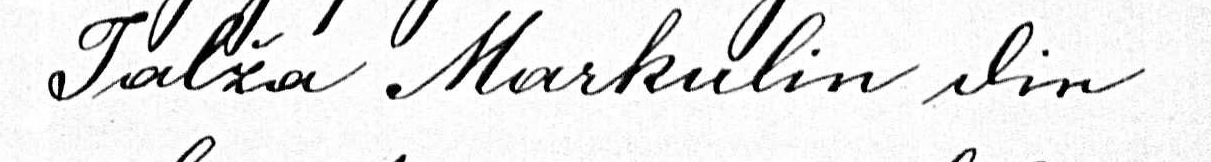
Jalža Markulin die
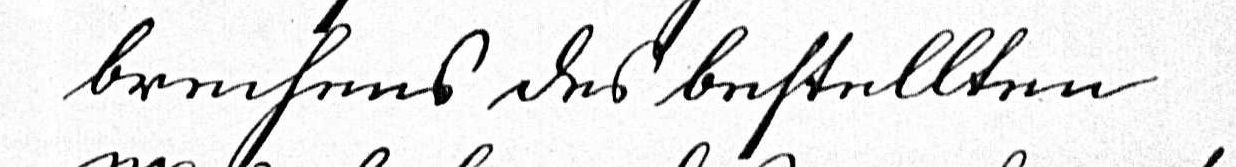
brechens des bestellten
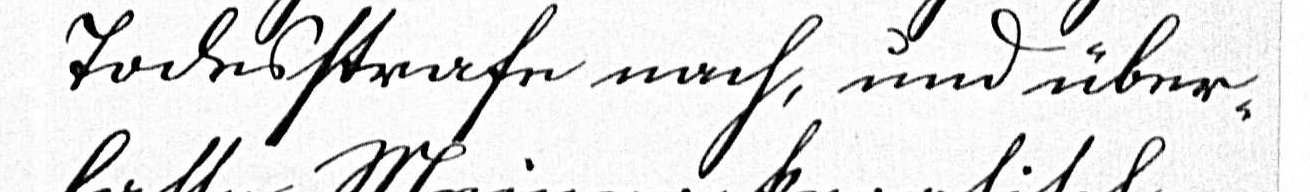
Todesstrafe nach, und über¬
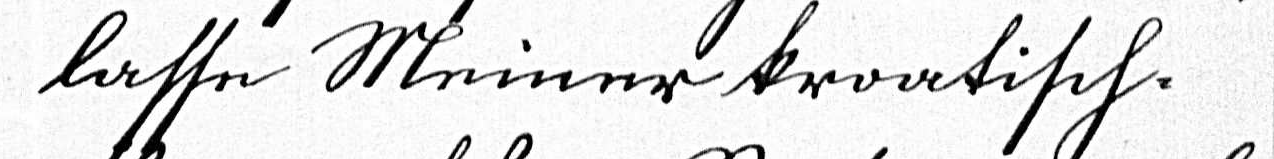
lasse Meiner kroatisch¬
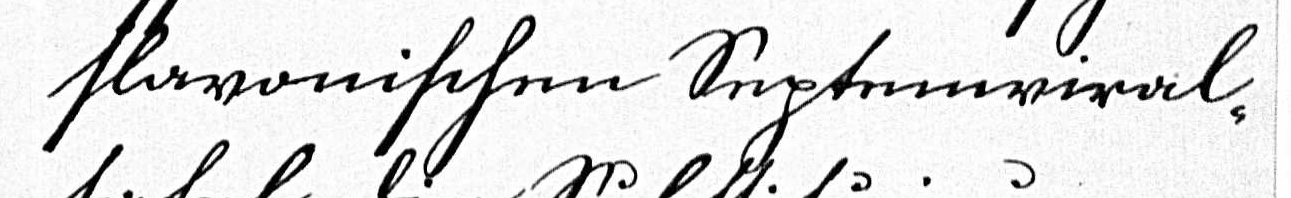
slavonischen Septemviral¬
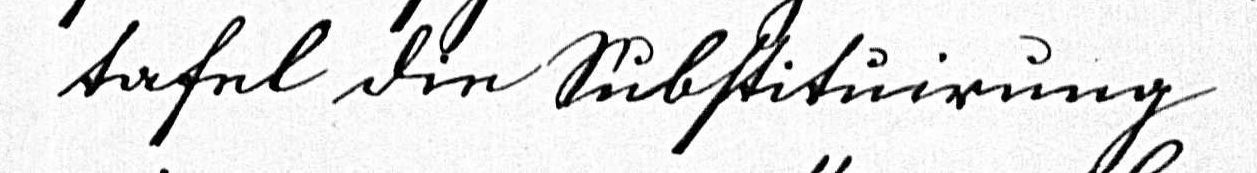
tafel die Substituirung
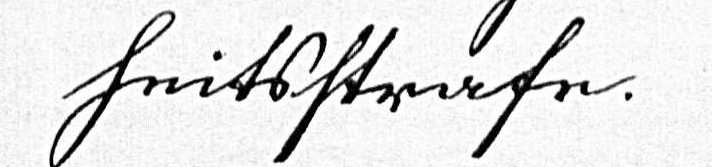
heitsstrafe.
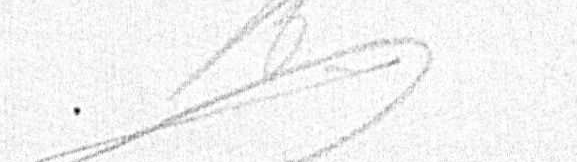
xx
